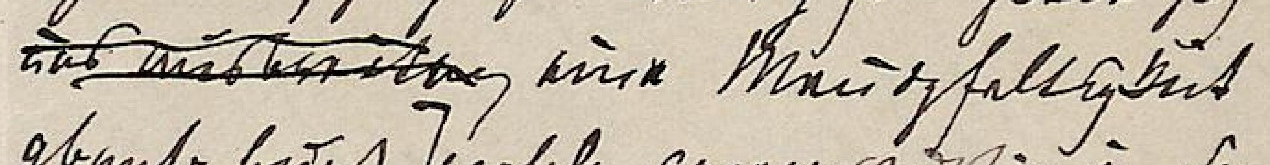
uns ausbreiten, eine Manigfaltigkeite
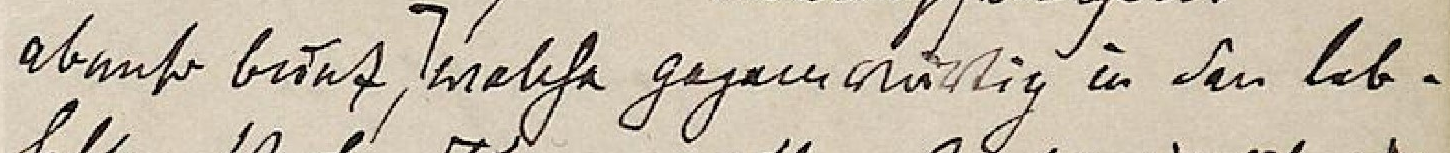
ebenso bunt, welche gegenwärtig in den leb¬
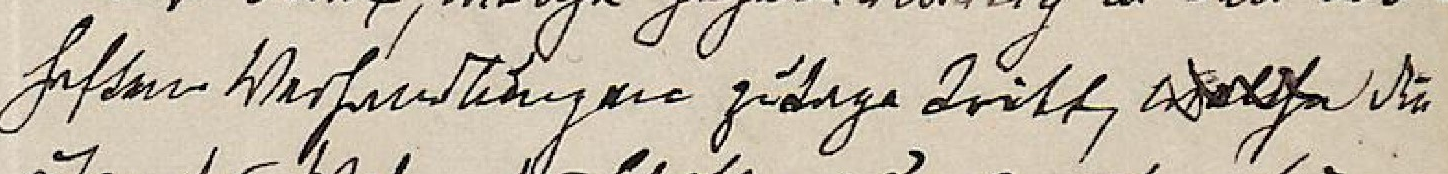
haften Verhandlungen zutage tritt, welche die
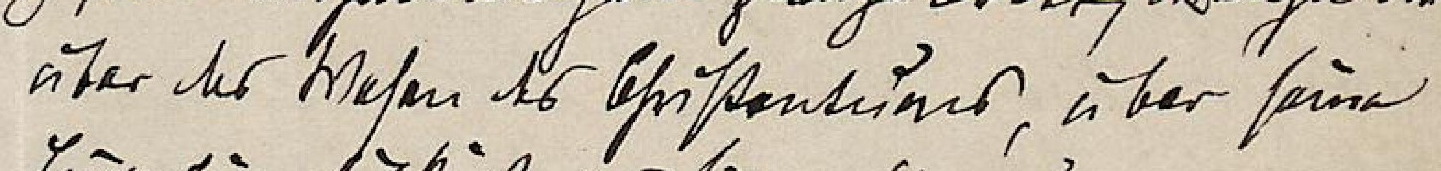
über das Wesen des Christentums, über seine
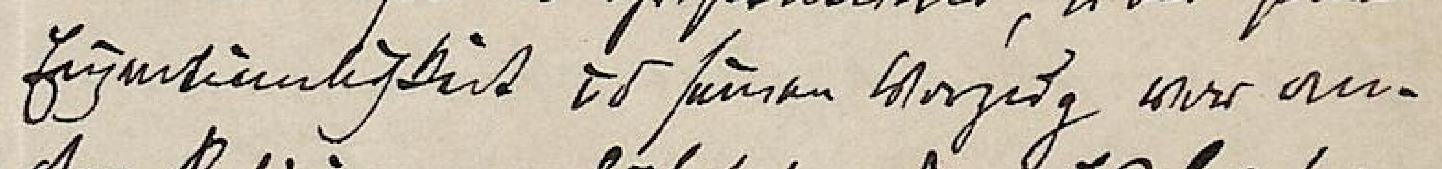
Eigentümlichkeit und seinen Vorzug vor an¬
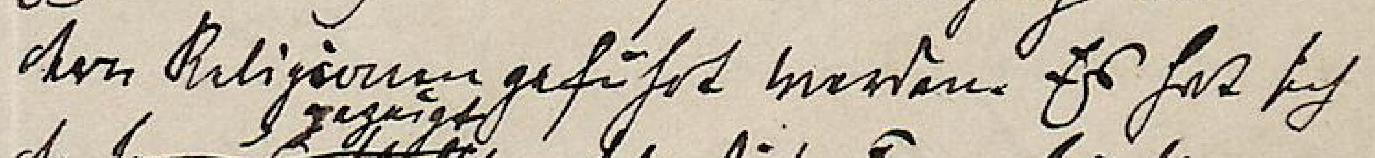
dern Religionen geführt werden. Es hat sich
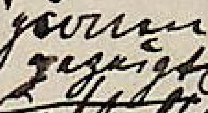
gezeigt
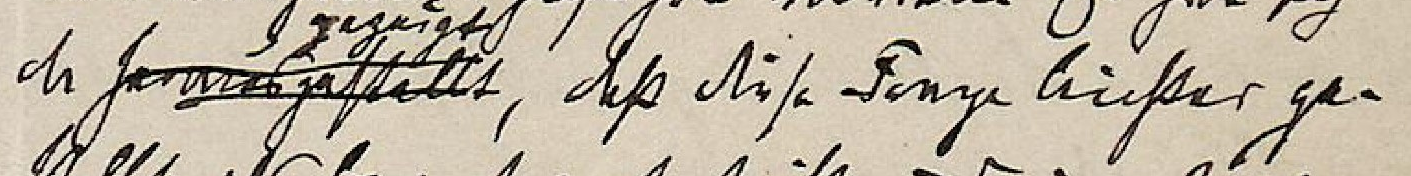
da herausgestellt, daß diese Frage leichter ge¬
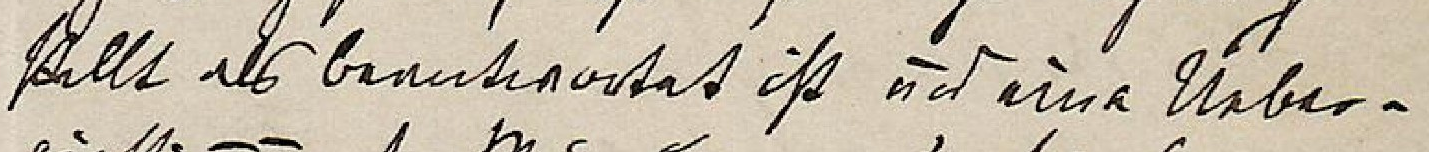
stellt als beantwortet ist und eine Ueber¬
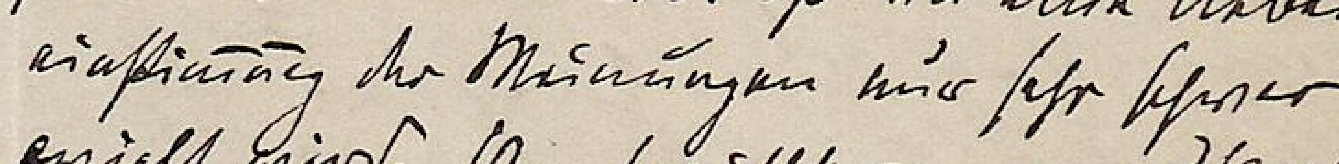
einstimung der Meinungen nur sehr schwer
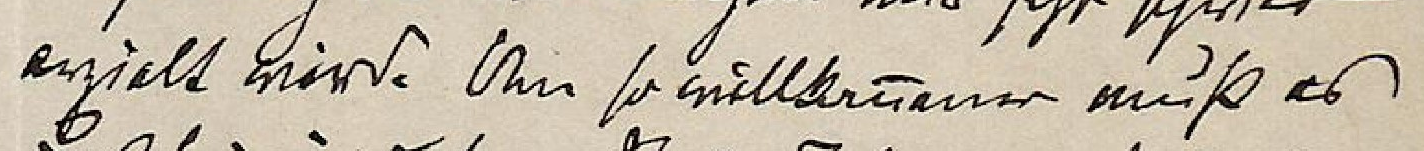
erzielt wird. Um so willkomener muß es
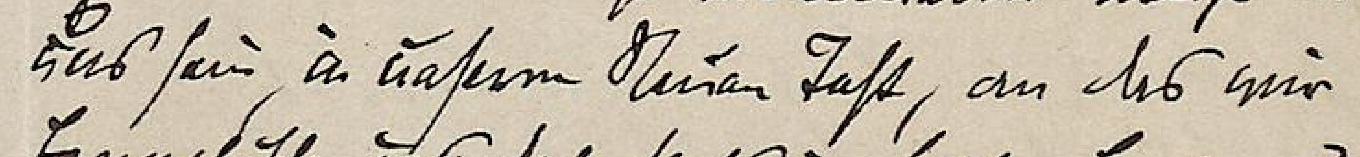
uns sein in unserem Neuen Test, an das wir
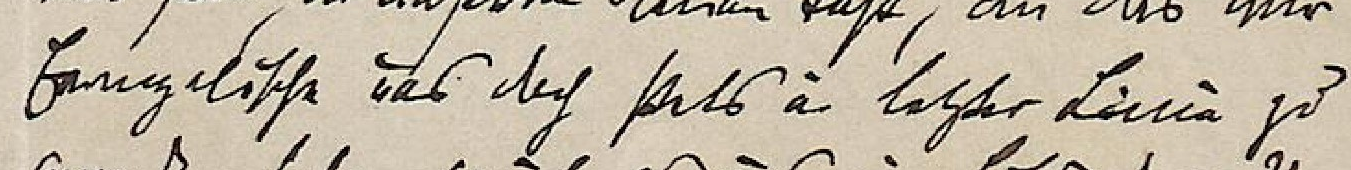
Evangelische, uns doch stets in letzter Linie zu
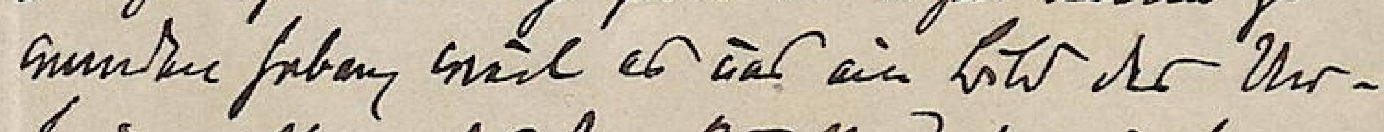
wenden haben, weil es uns ein Bild des Ur¬
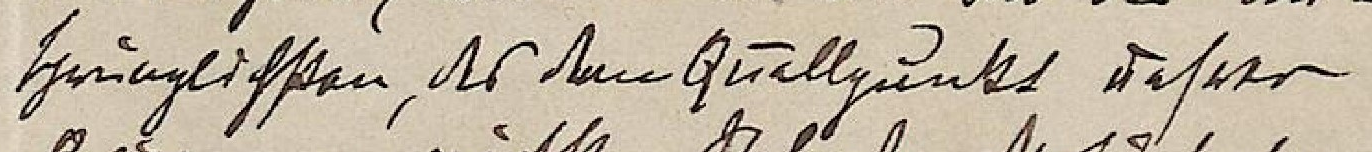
sprünglichsten, des den Quellpunkt unsrer
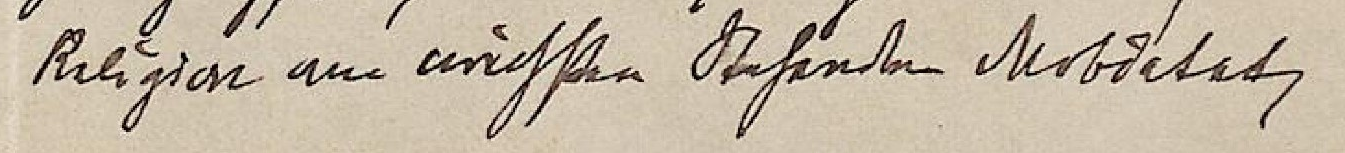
Religion am nächsten Stehenden darbietet,
